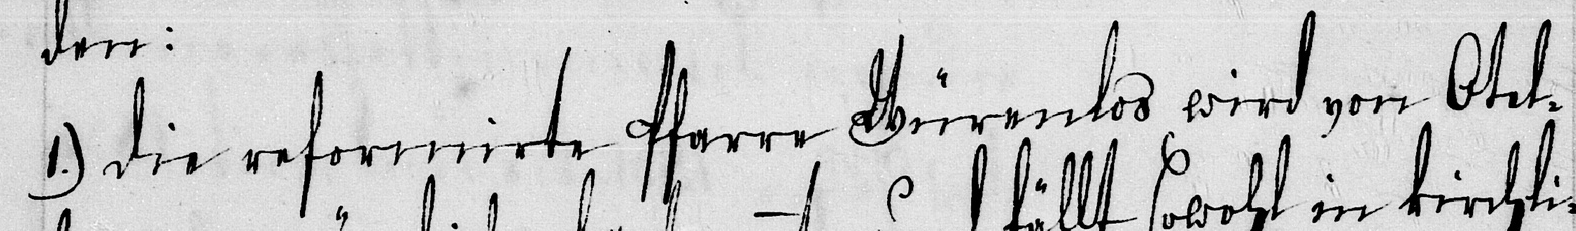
1.) die reformirte Pfarre Würenlos wird von Otel¬
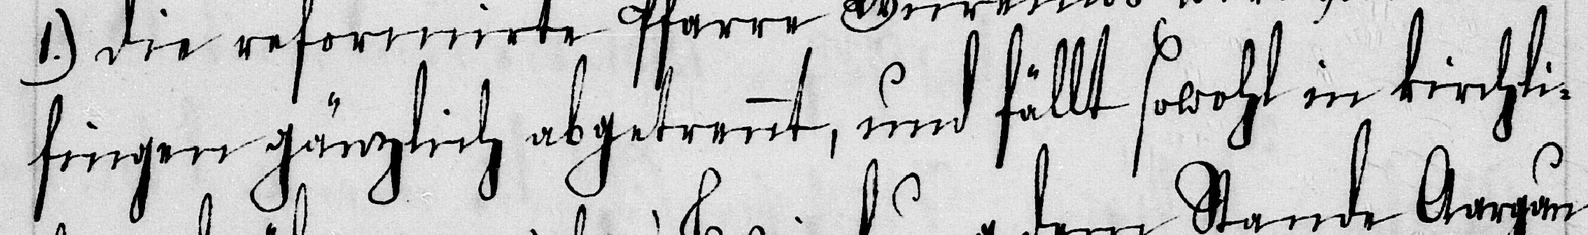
fingen gänzlich abgetrennt, und fällt sowohl in kirchli¬
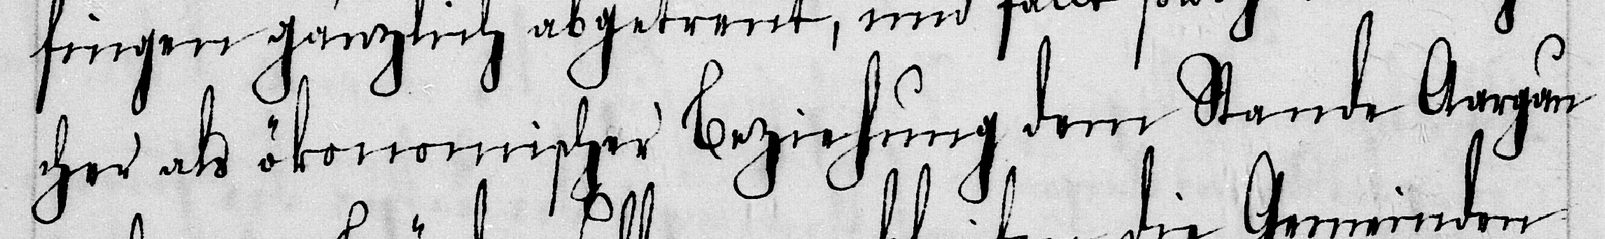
cher als ökonomischer Beziehung dem Stande Aargau
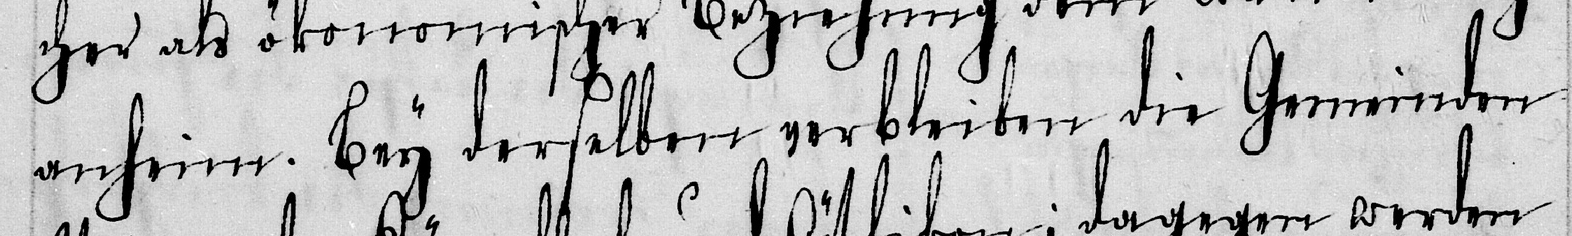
anheim. Bey derselben verbleiben die Gemeinden
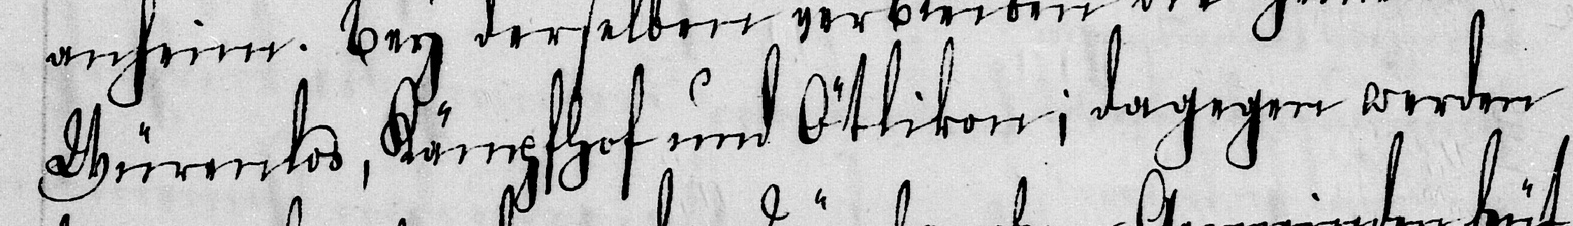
Würenlos, Kämpfhof und Ötlikon; dagegen werden
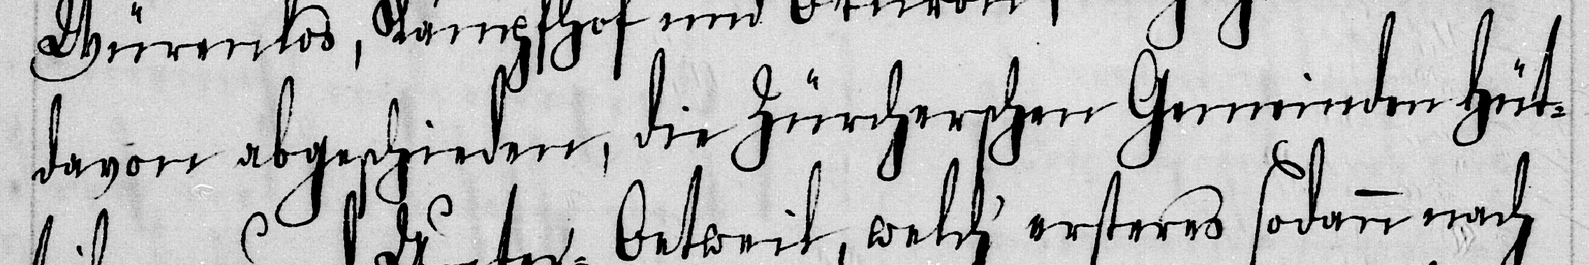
davon abgeschieden, die Zürcherschen Gemeinden Hüt¬
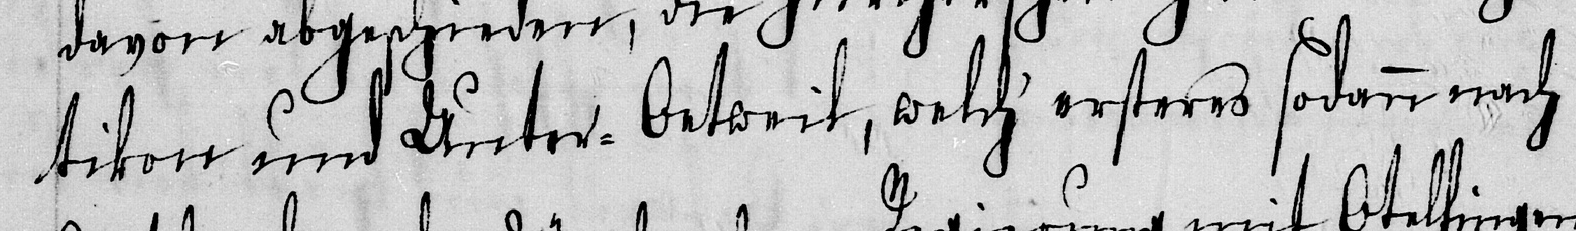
tikon und Unter-Oetweil, welch’ ersteres sodann nach
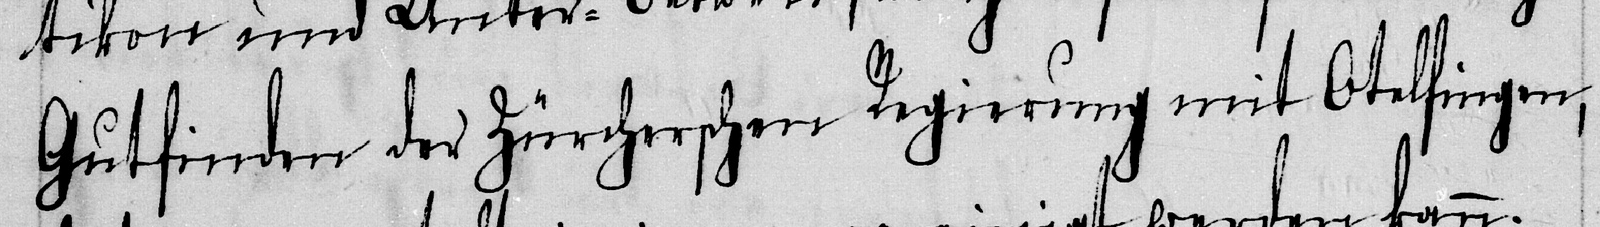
Gutfinden der Zürcherschen Regierung mit Otelfingen,
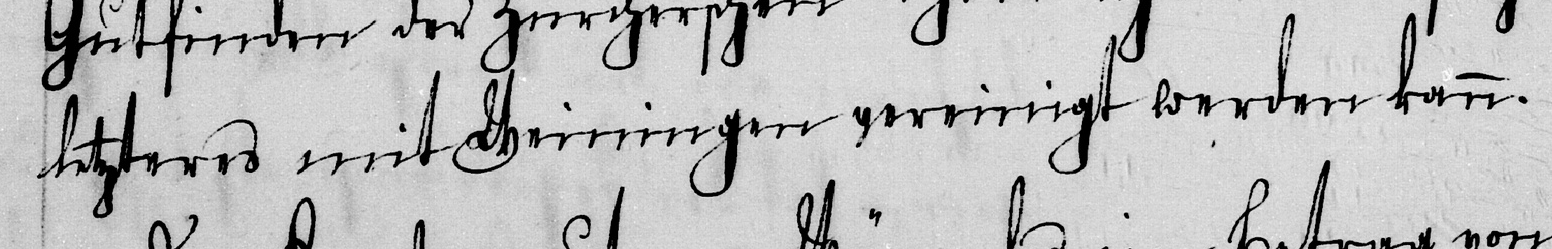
letzteres mit Weiningen vereinigt werden kann.
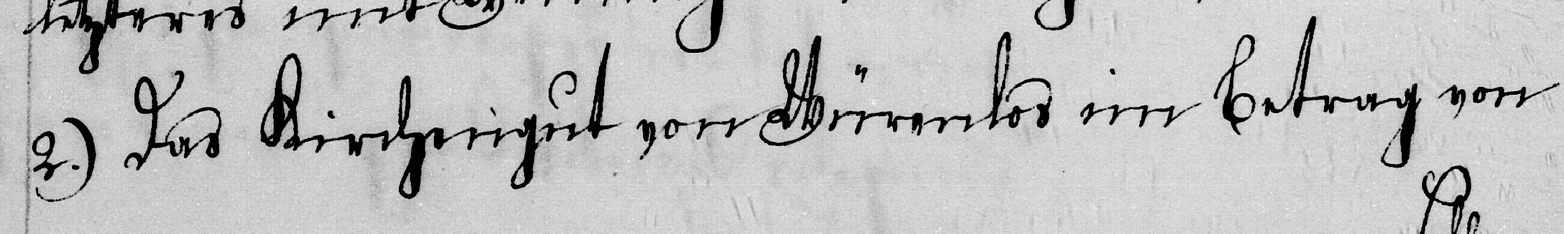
2.) Das Kirchengut von Würenlos im Betrag von
